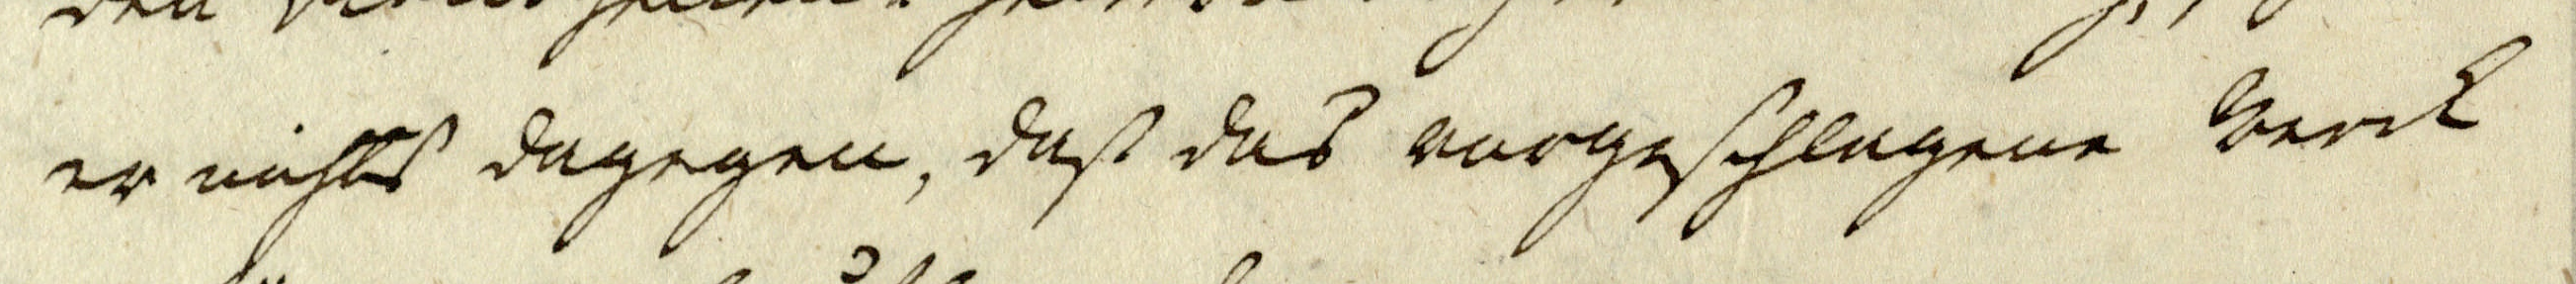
er nichts dagegen, daß das vorgeschlagene Werck
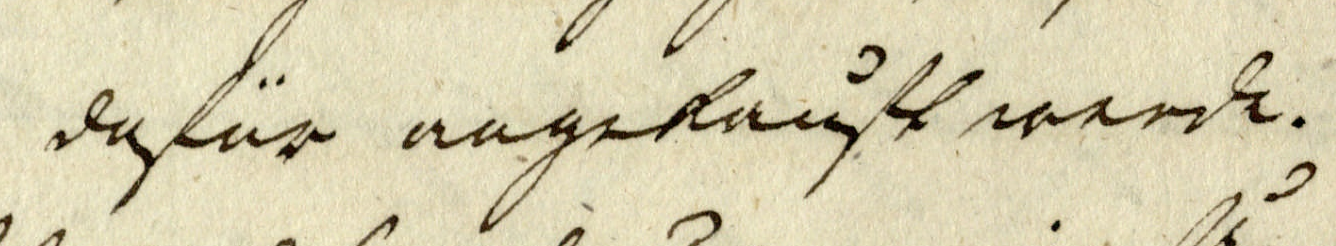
dafür angekauft werde.
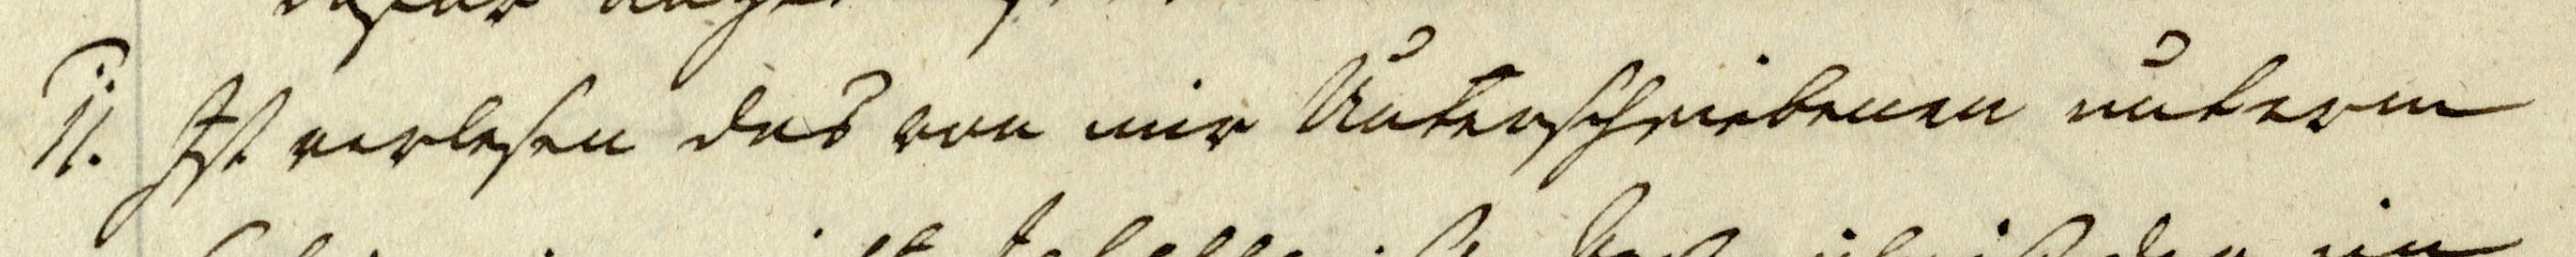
11. Ist verlesen das von nur Unterschiebenen unterm
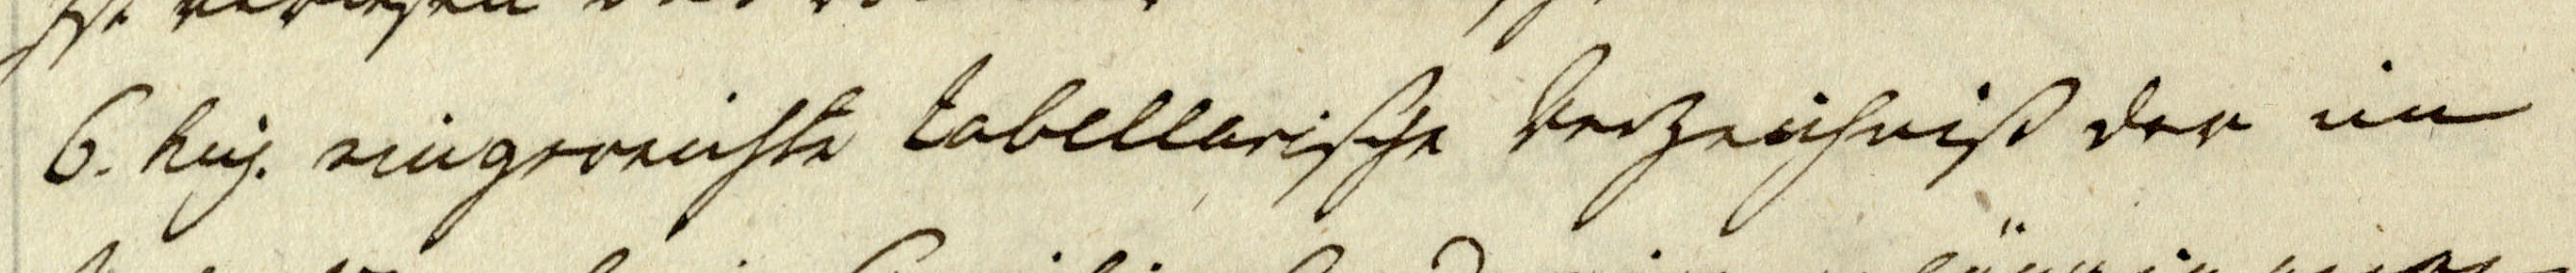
6. huj. eingereichte tabellarische Verzeichnis der im
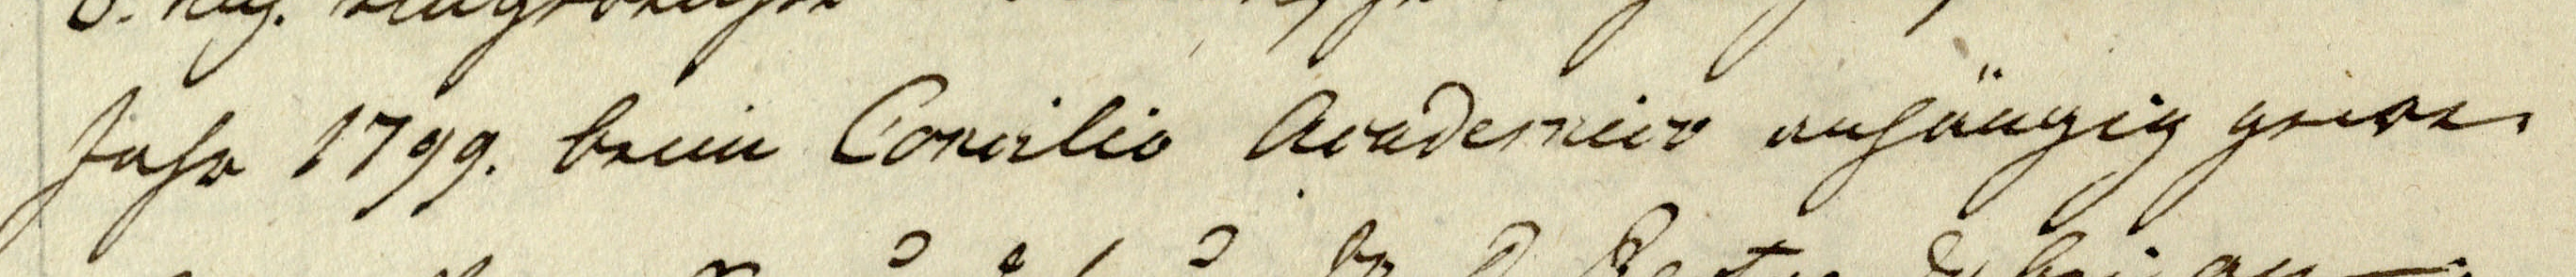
Jahr 1799. beim Concilio Academico anhängig gewe¬
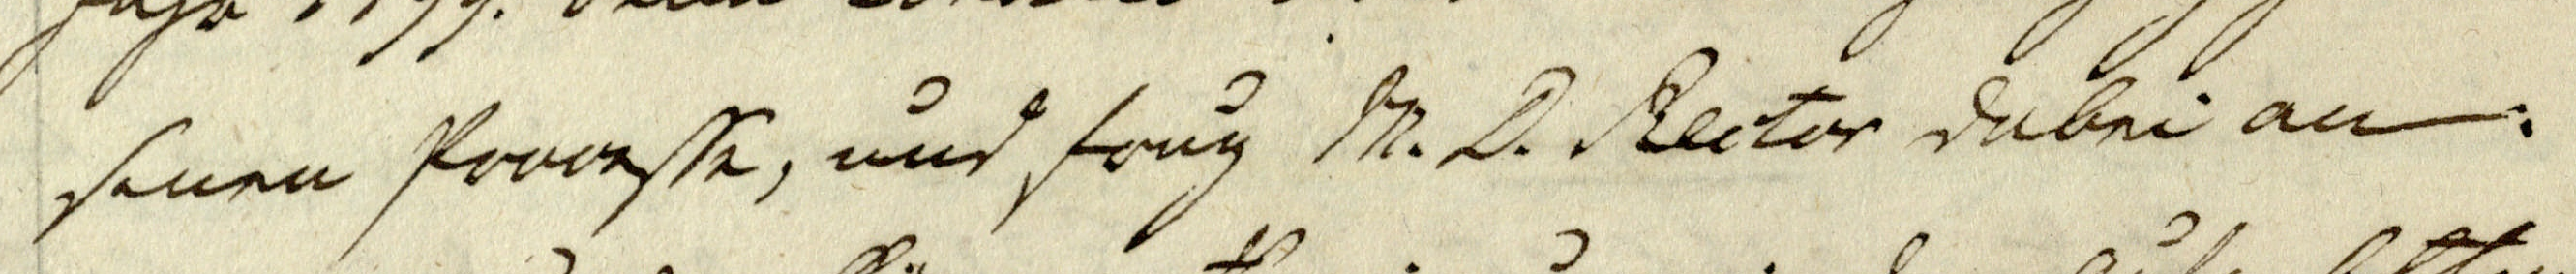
senen Processe, und frug M. D. Rector dabei an:
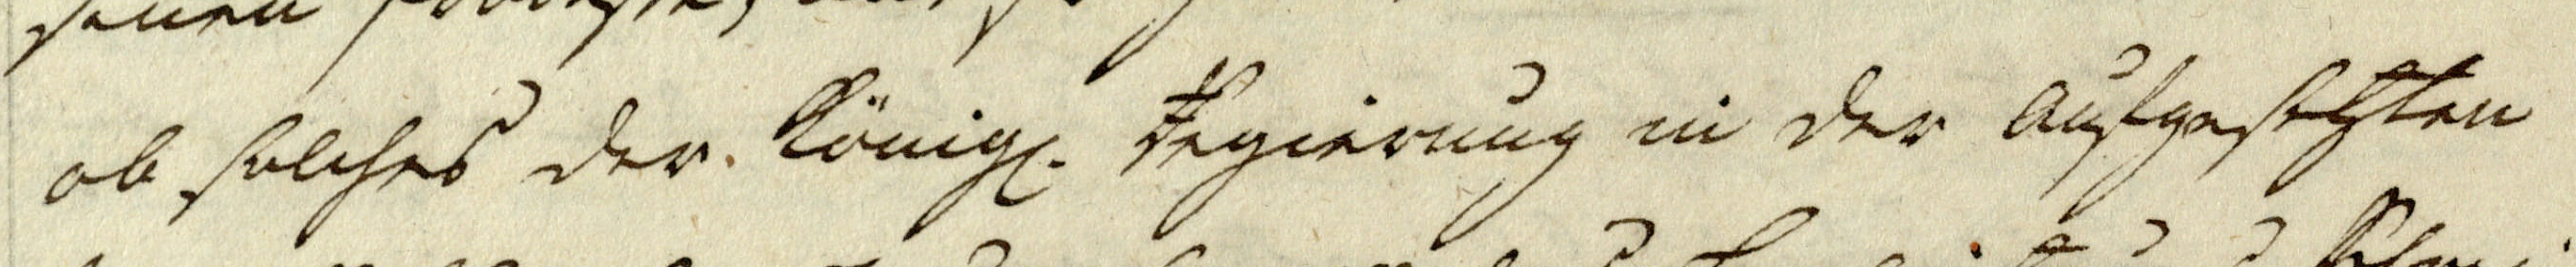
ob solches der Königl. Regierung in der aufgesetzten
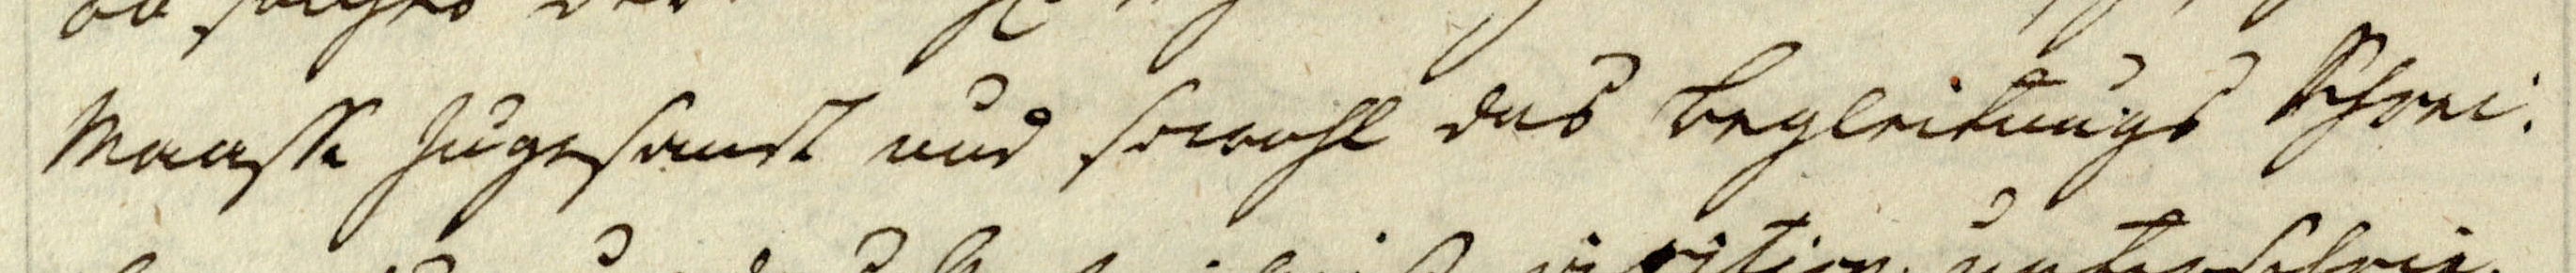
Maasse zugesandt und sowohl das Begleitungs Schrei¬
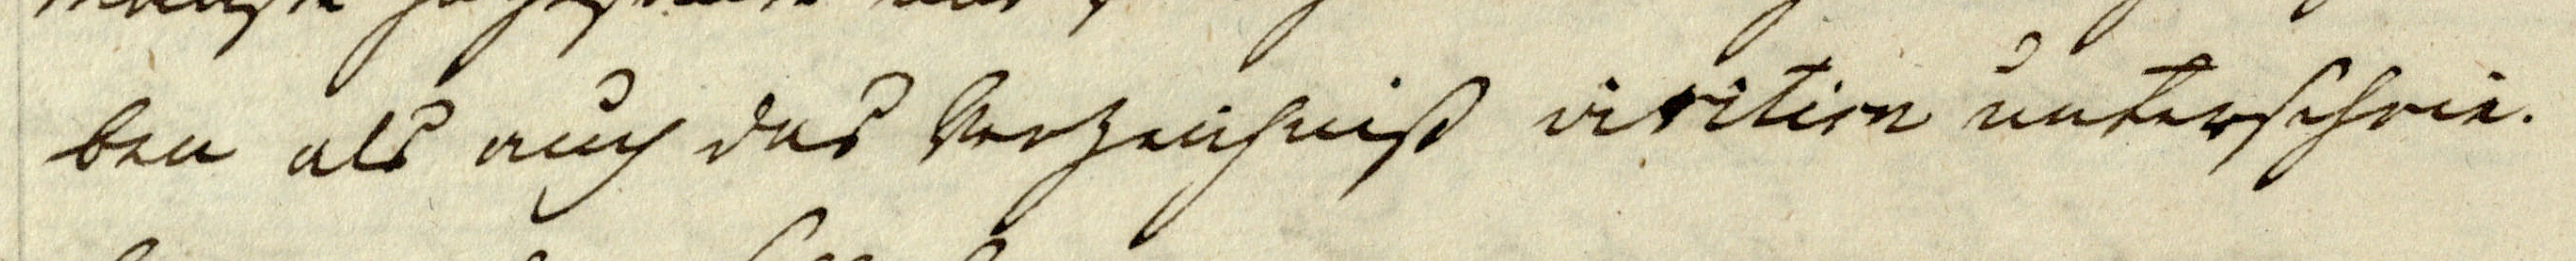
ben als auch das Verzeichnis viritim unterschrie¬
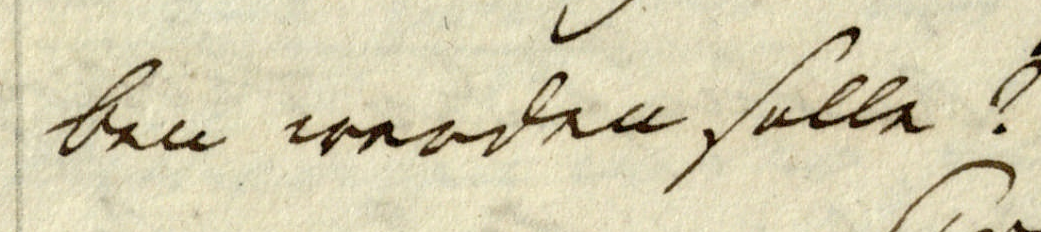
ben werden solle?
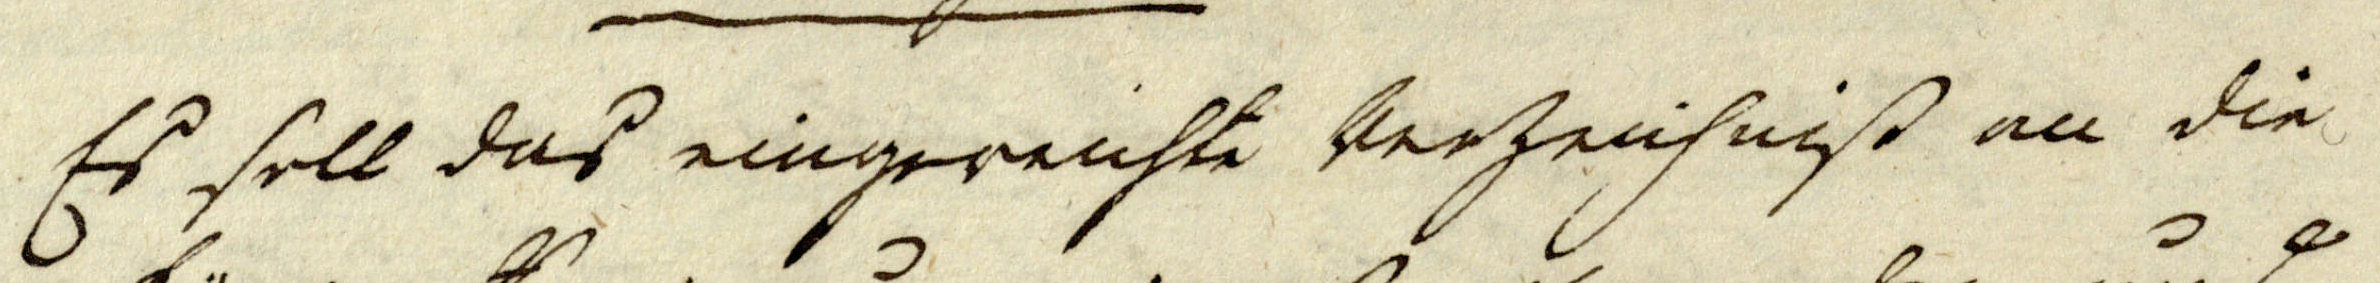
Es soll das eingereichte Verzeichnis an die
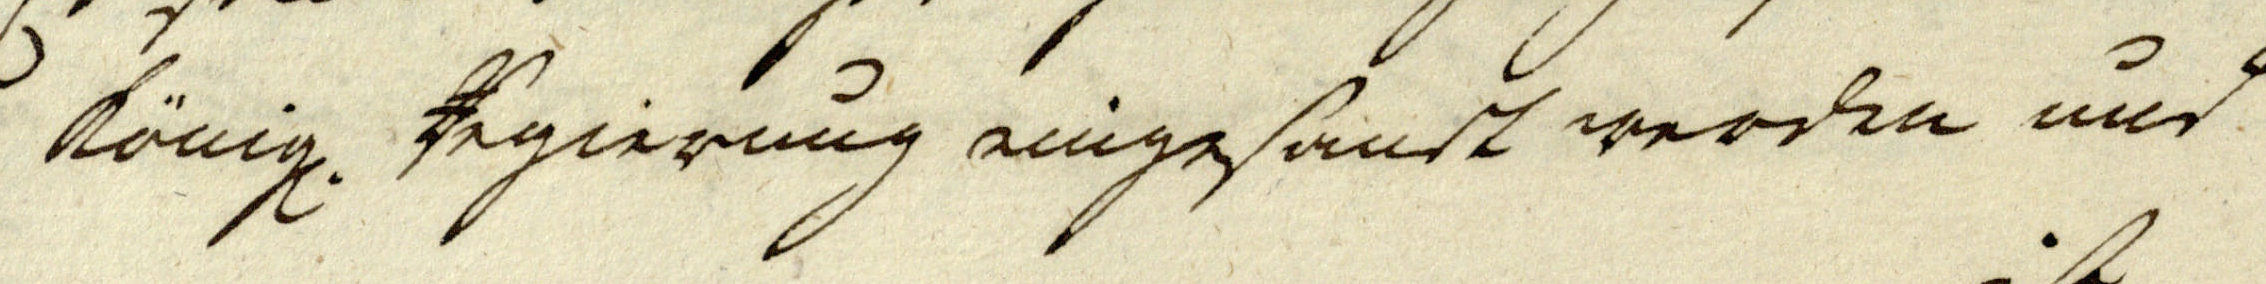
Königl. Regierung eingesandt werden und
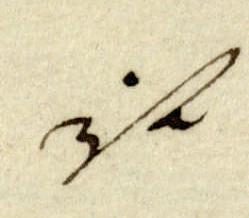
ist
